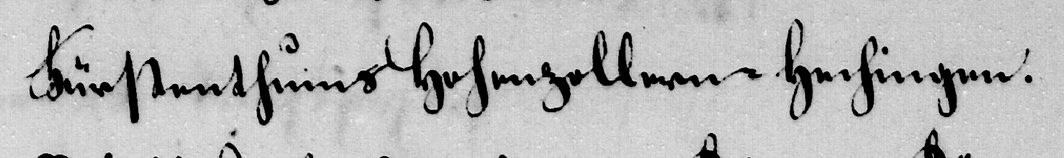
Fürstenthums Hohenzollern-Hechingen.
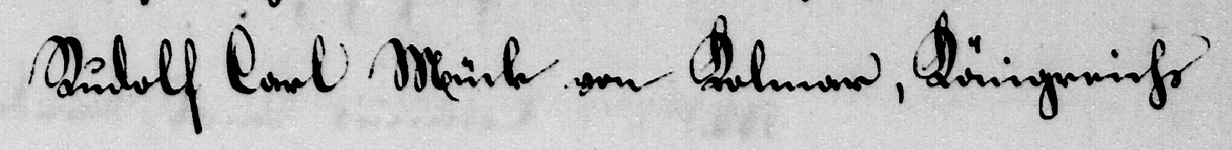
Rudolf Carl Mücke von Kolmar, Königreichs
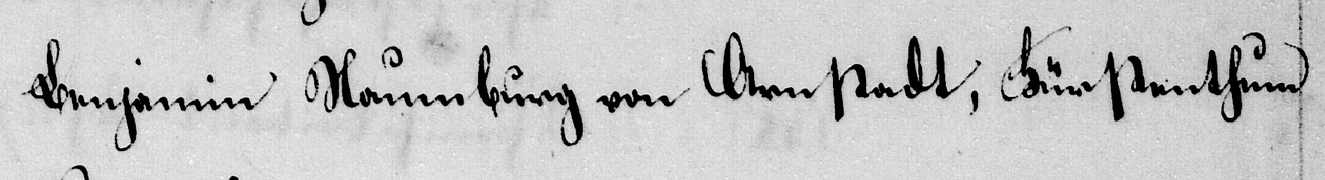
Benjamin Naumburg von Arnstadt, Fürstenthum
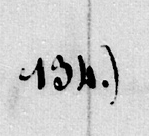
134.)
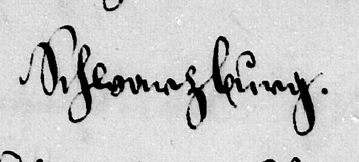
Schwarzburg.
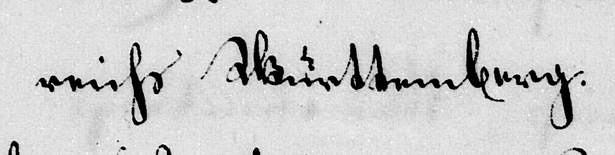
reichs Württemberg.
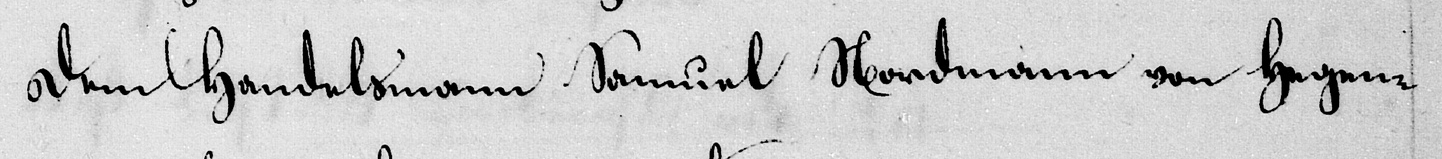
Dem Handelsmann Samuel Nordmann von Hegen¬
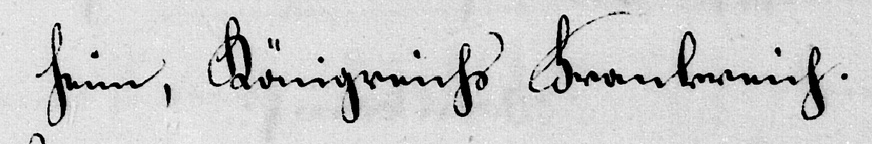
heim, Königreichs Frankreich.
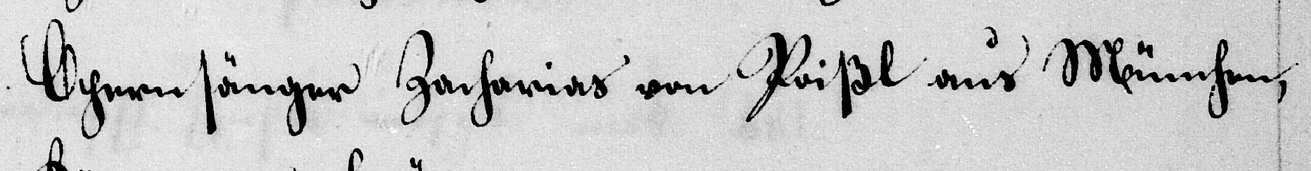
Opernsänger Zacharias von Poißl aus München,
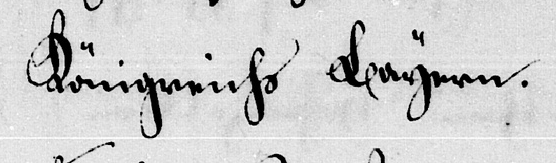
Königreichs Bayern.
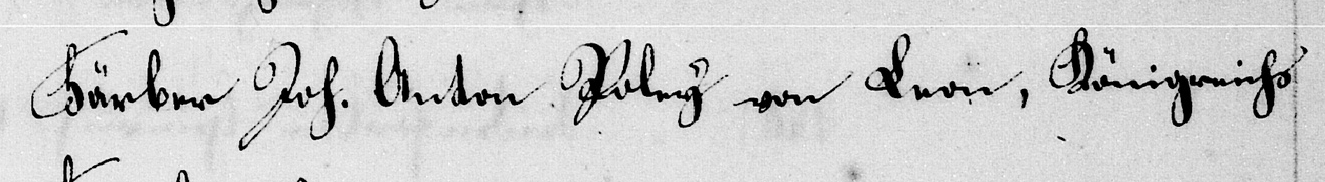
Färber Joh. Anton Poley von Leon, Königreichs
